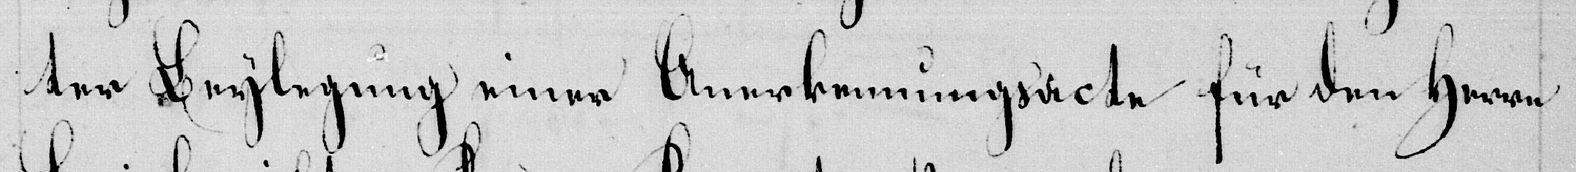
ter Beylegung einer Anerkennungsacte für den Herrn
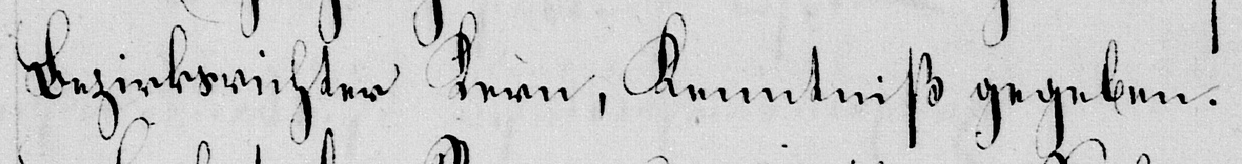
Bezirksrichter Kern, Kenntniß gegeben.
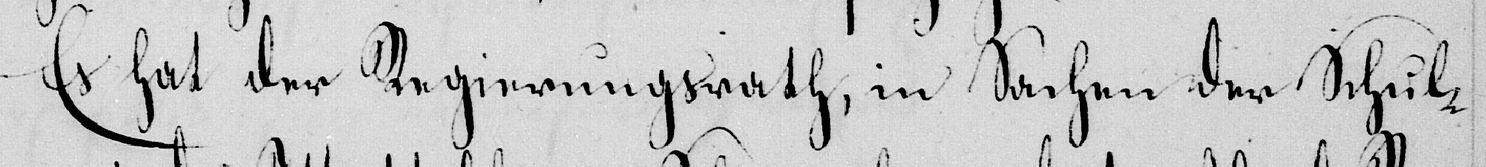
Es hat der Regierungsrath, in Sachen der Schul¬
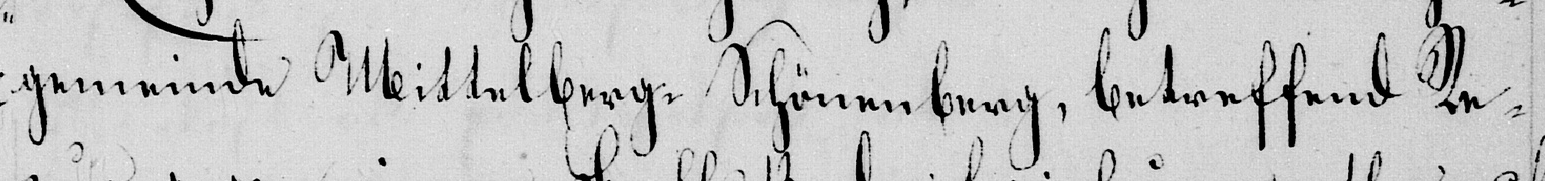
gemeinde Mittelberg-Schönenberg, betreffend Re¬
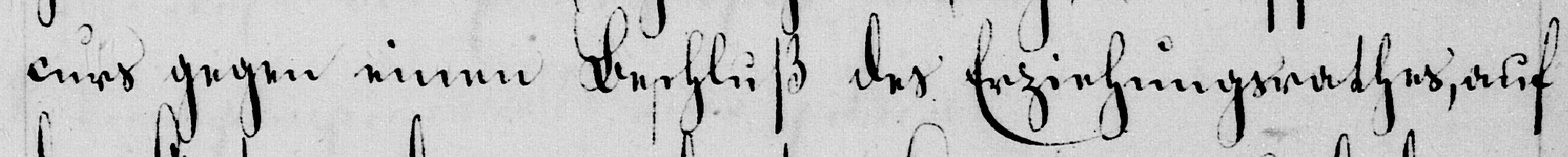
curs gegen einen Beschluß des Erziehungsrathes, auf
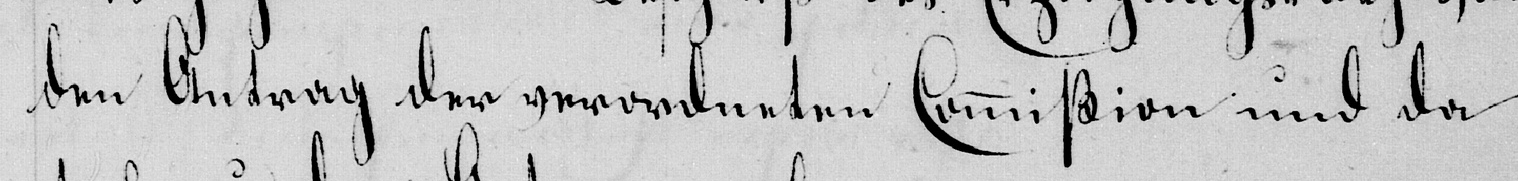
den Antrag der verordneten Commißion und da
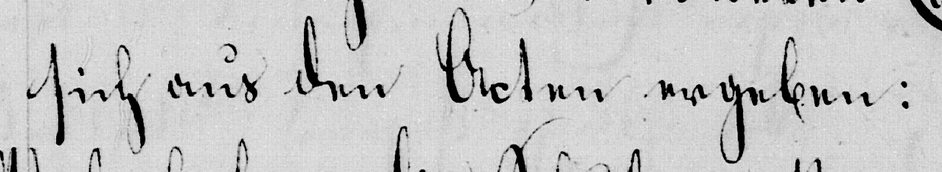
sich aus den Acten ergeben:
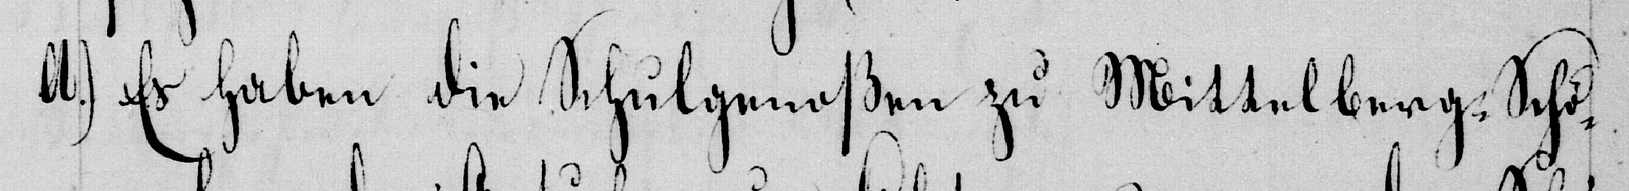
A.) Es haben die Schulgenoßen zu Mittelberg-Schö¬
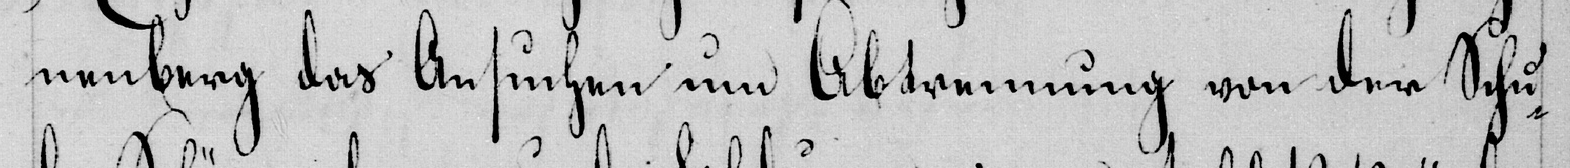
nenberg das Ansuchen um Abtrennung von der Schu¬
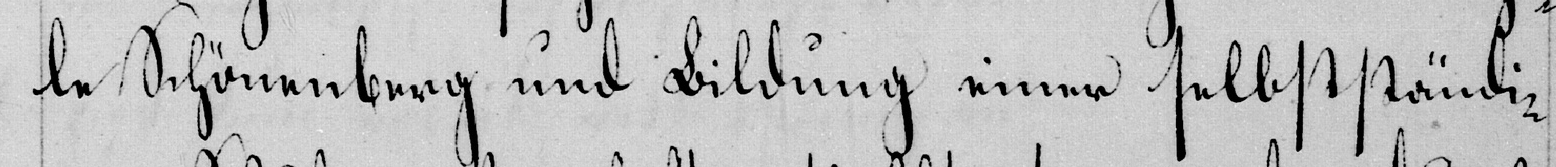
le Schönenberg und Bildung einer selbstständi¬
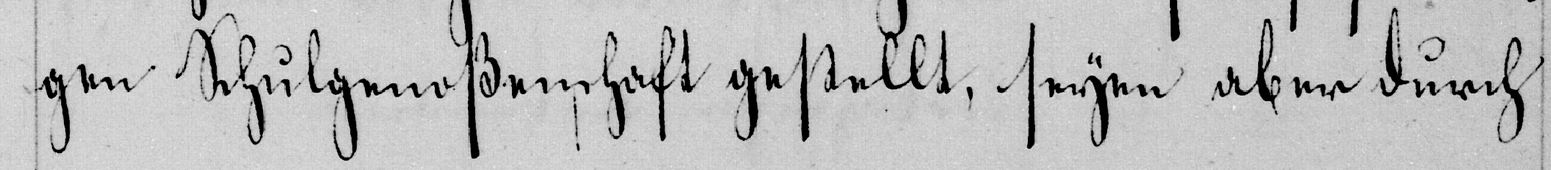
gen Schulgenoßenschaft gestellt, seyen aber durch
